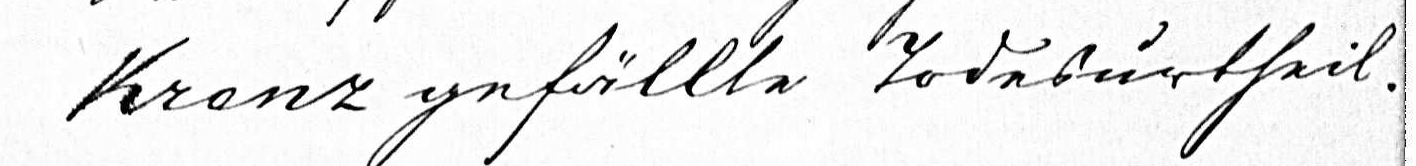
Kranz gefällte Todesurtheil
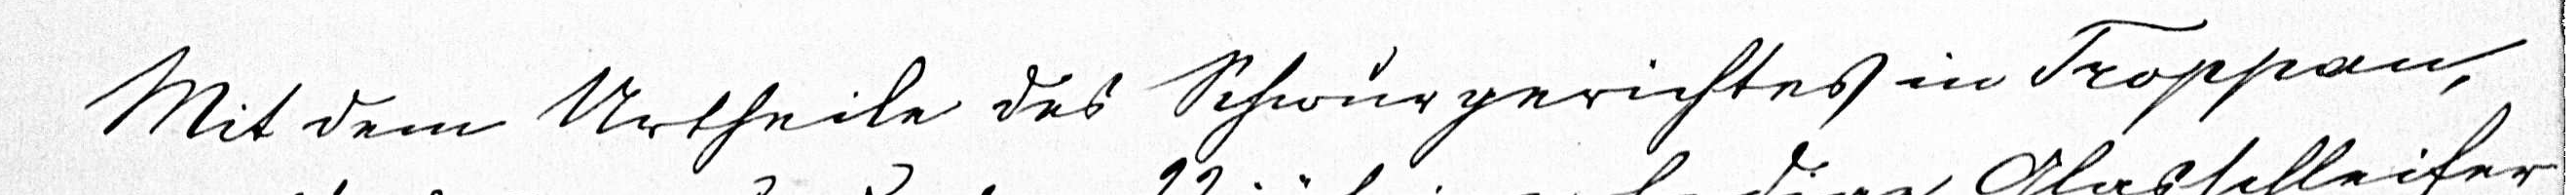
Mit dem Urtheile des Schwurgerichtes in Troppau,
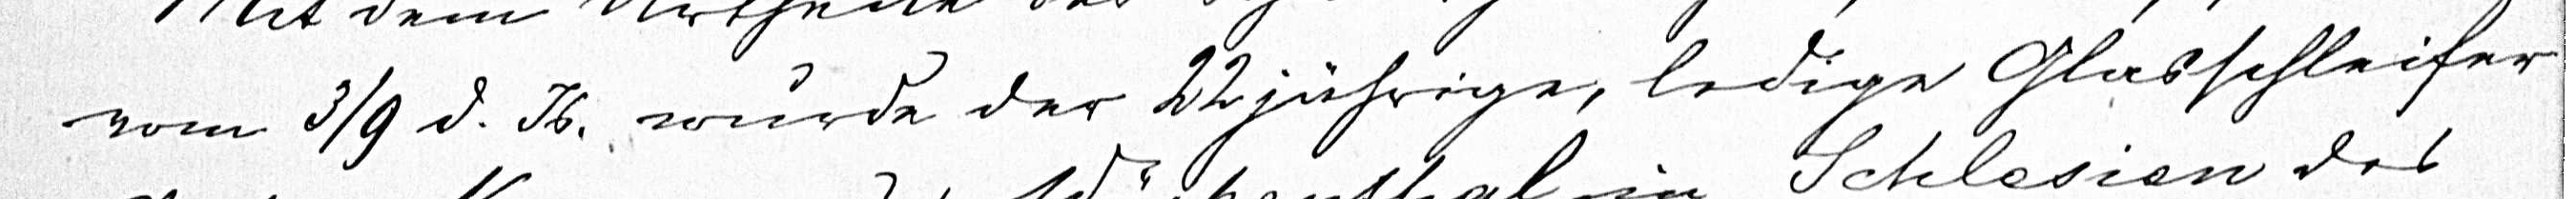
vom 3/9 d. Is, wurde der 22jährige, ledige Glasschleifer
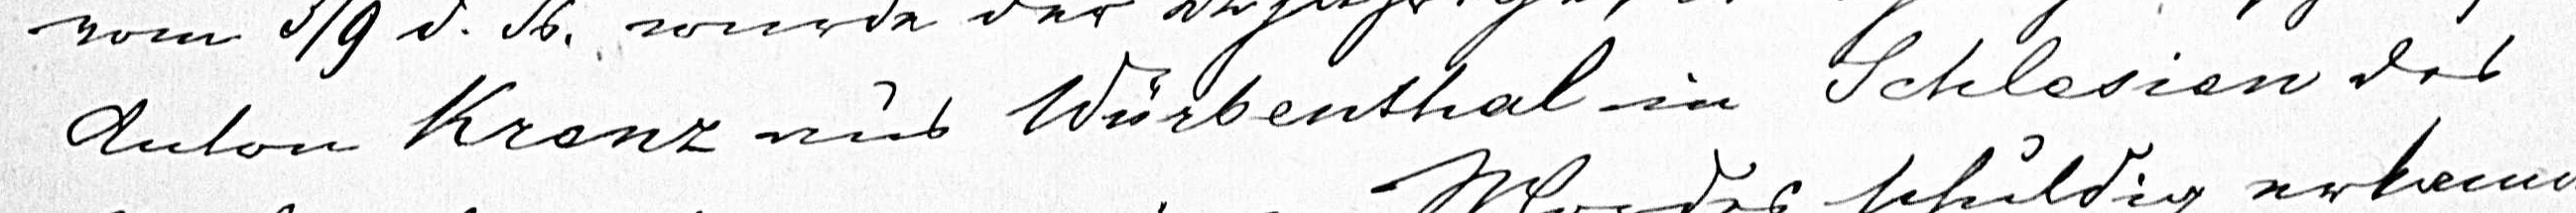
Anton Kranz aus Würbenthal in Schlesien des
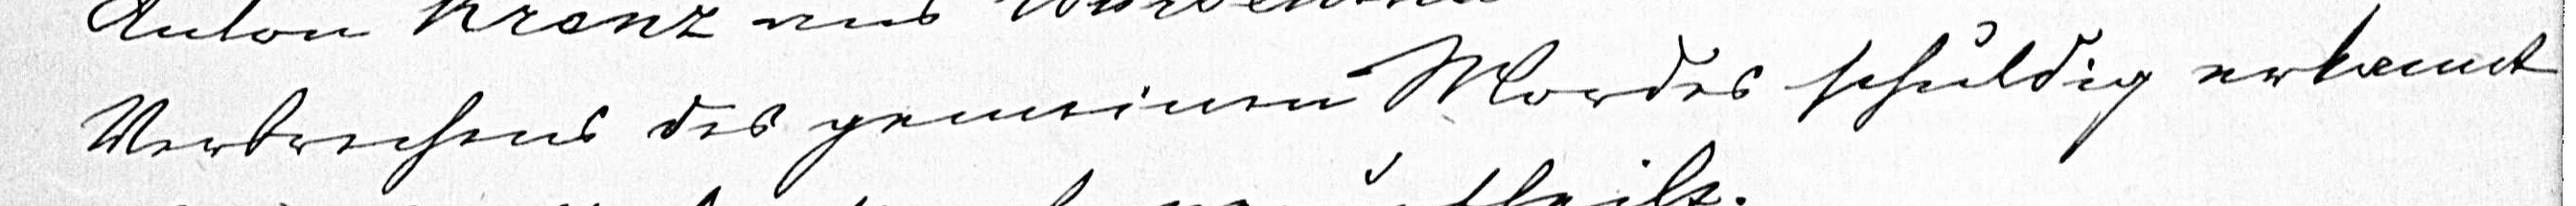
Verbrechens des gemeinen Mordes schuldig erkannt
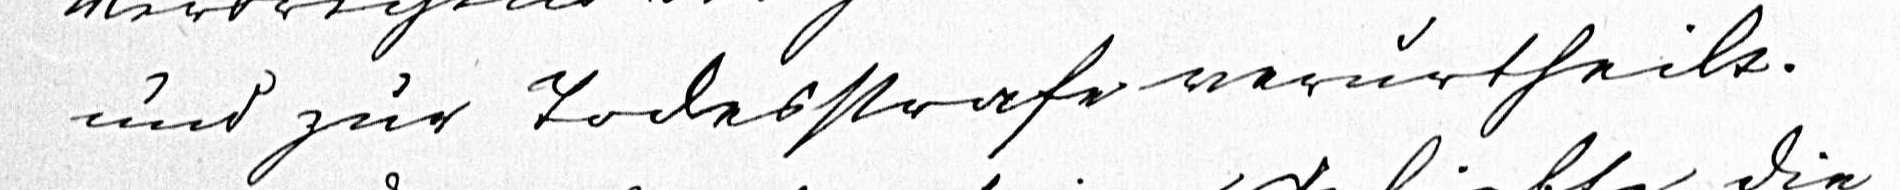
und zur Todesstrafe verurtheilt.
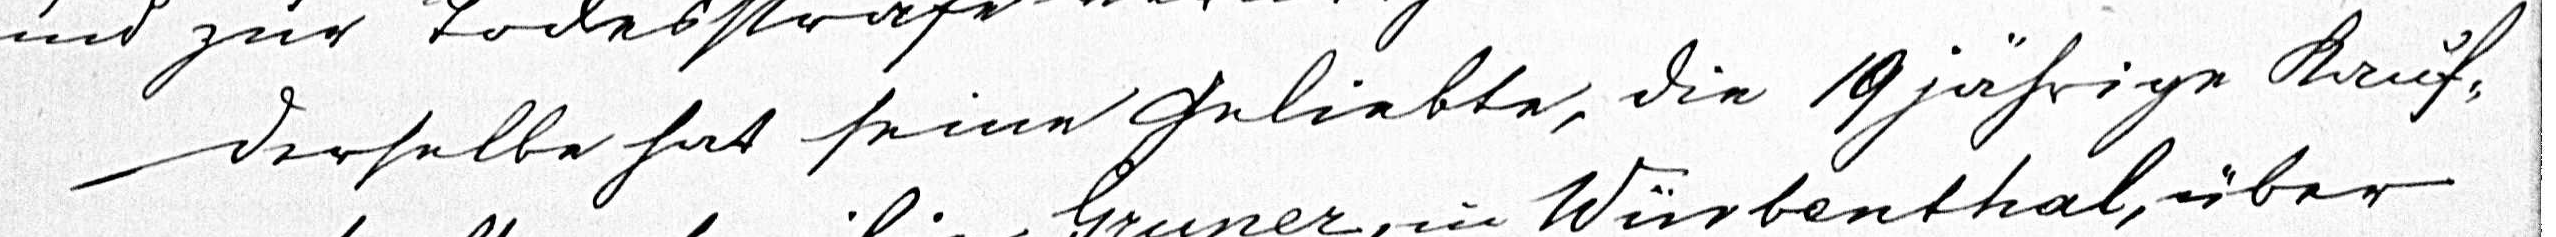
Derselbe hat seine Geliebte, die 19 jährige Kauf¬
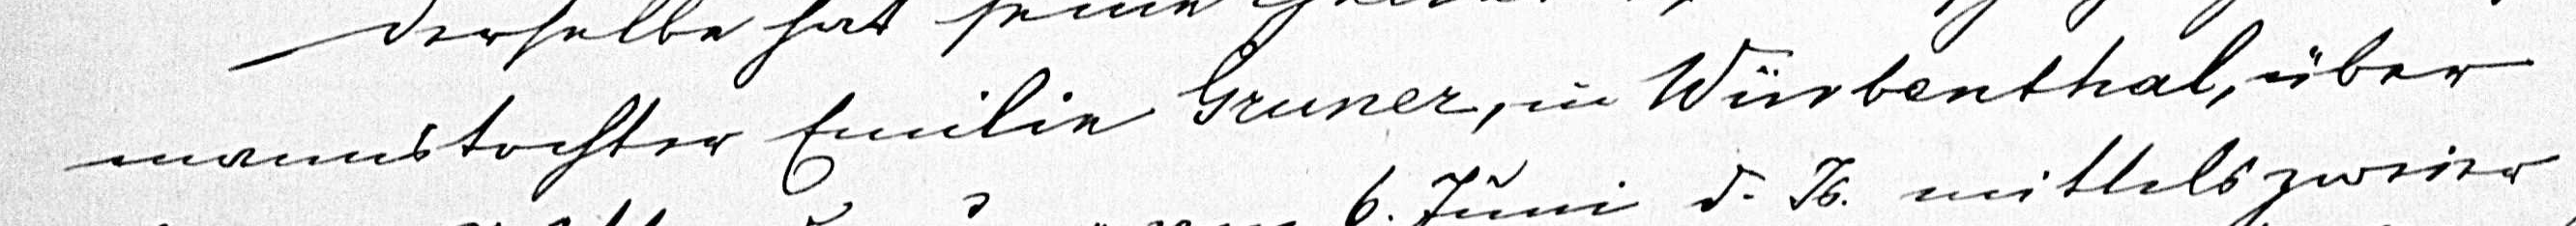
mannstochter Emilie Gruner, in Würbenthal, über
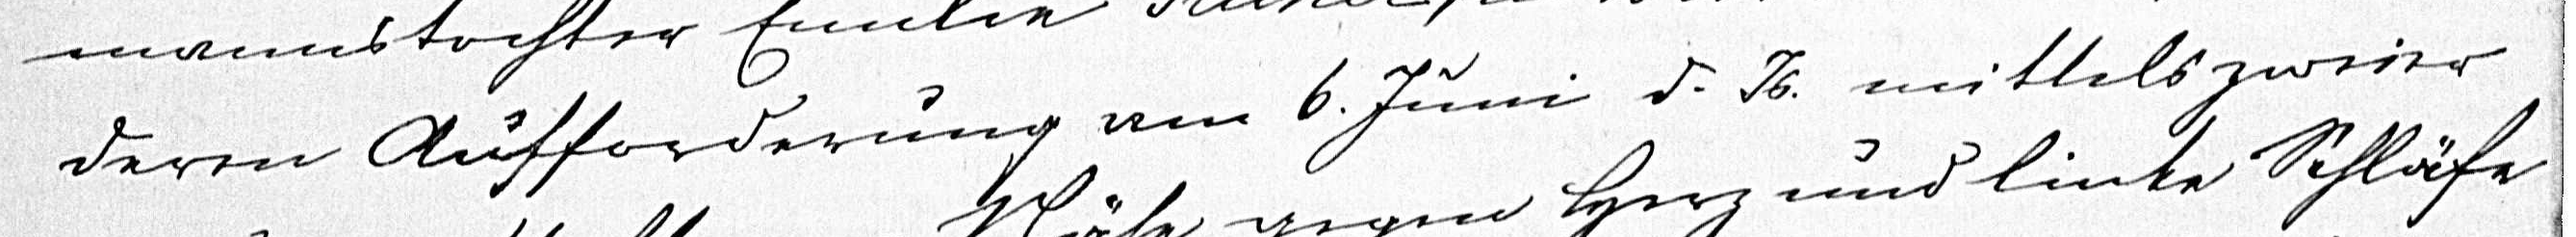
deren Aufforderung am 6. Juni d. Is. mittels zweier
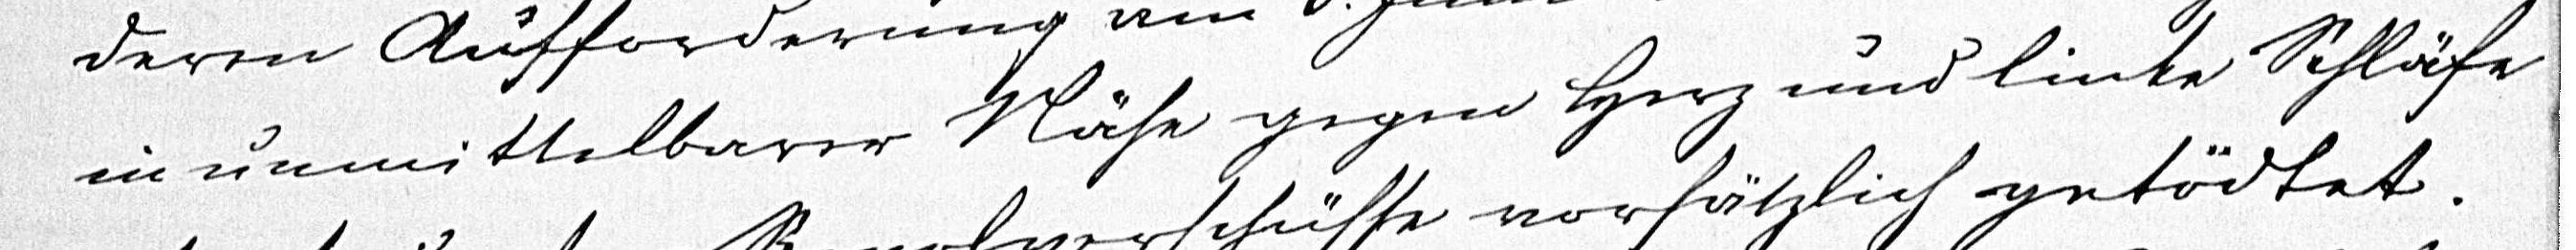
in unmittelbarer Nähe gegen Herz und linke Schläfe
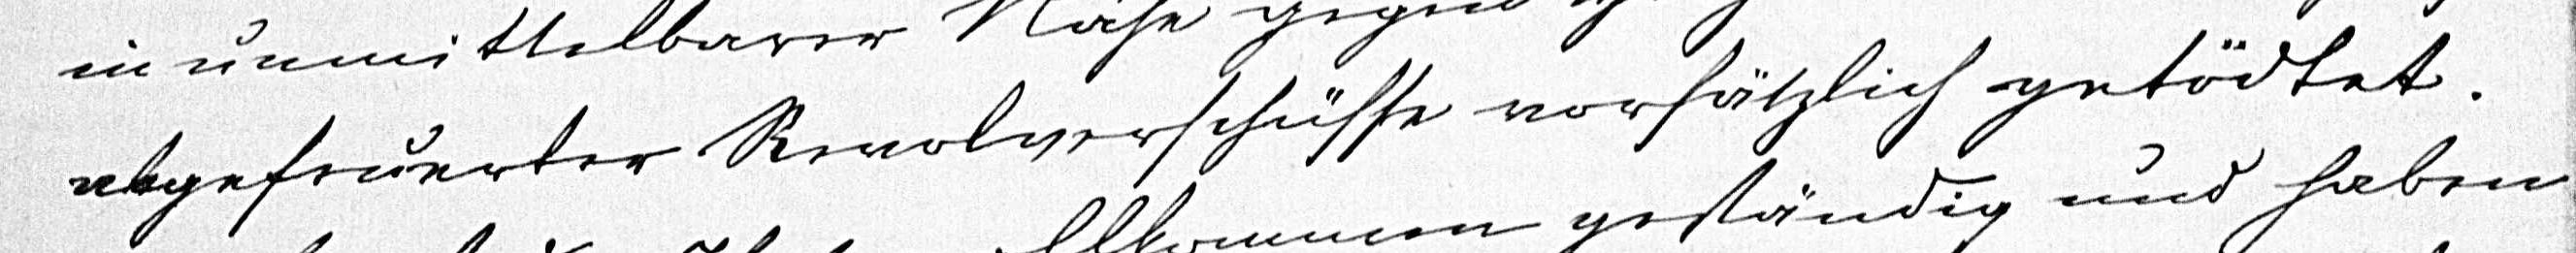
abgefeuerter Revolverschüsse vorsätzlich getödtet.
